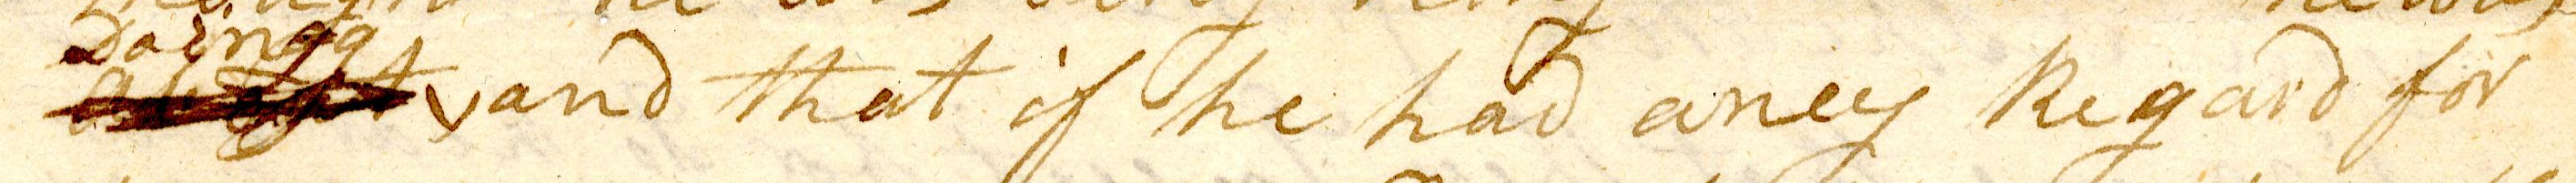[Alright] ^ and that if he had aney Regard for
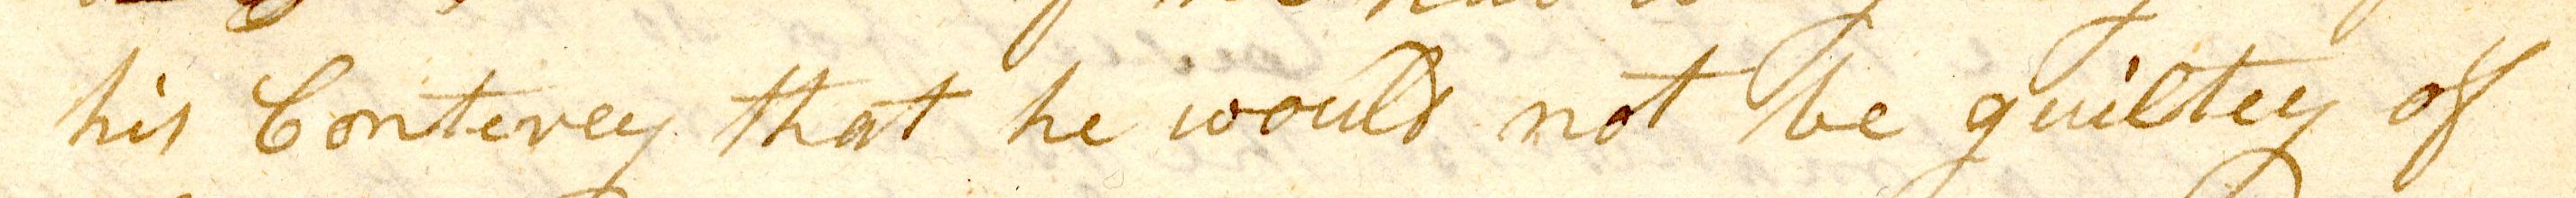his Conterey that he would not be guiltey of
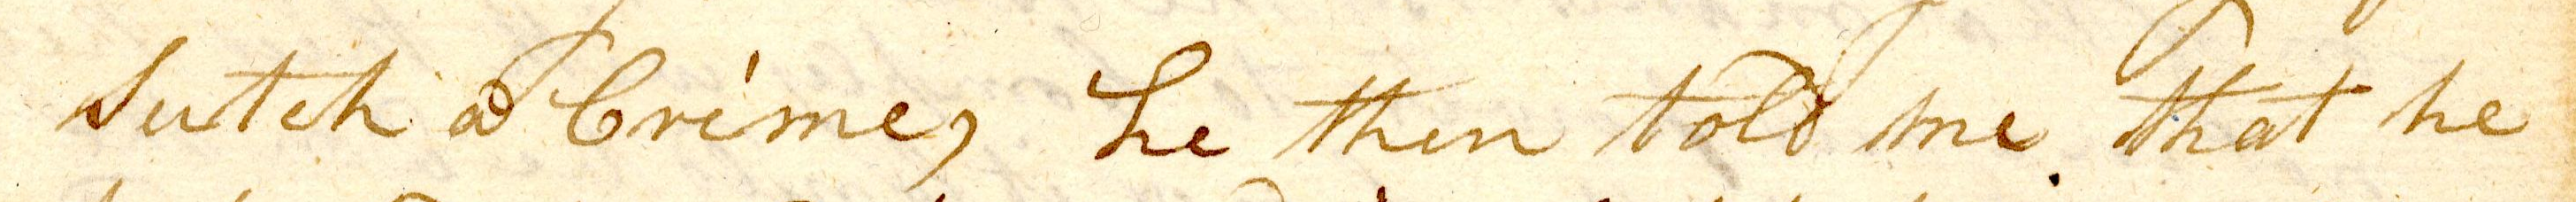Sutch a Crime, he then told me that he
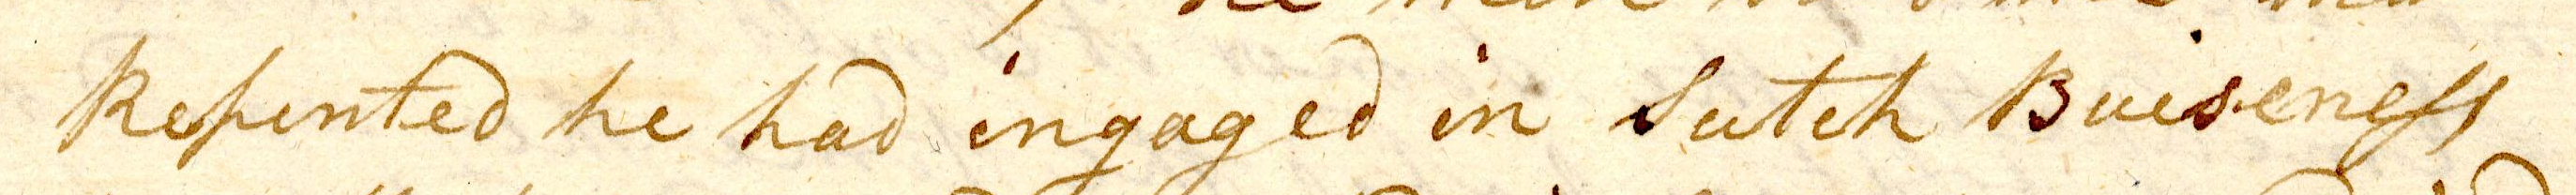Repented he had ingaged in Sutch Buiseness
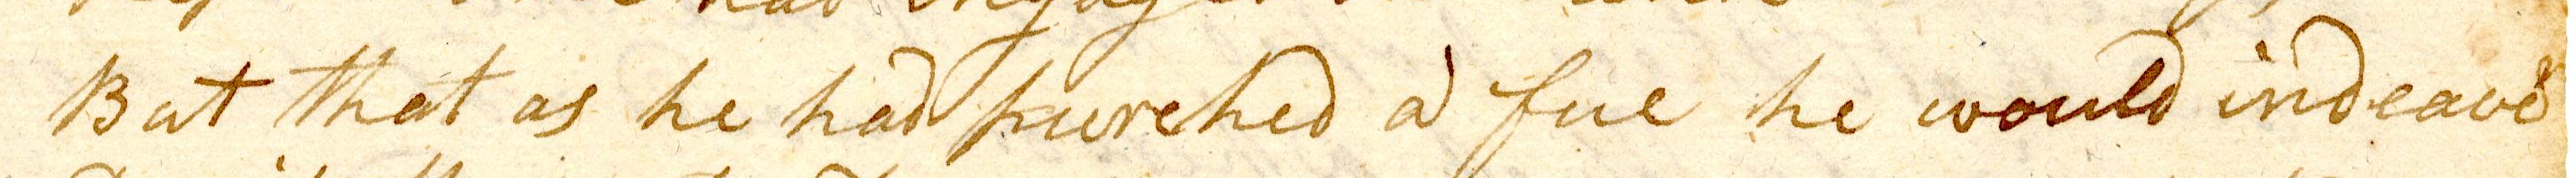But that as he had purched a fue he would indeaver
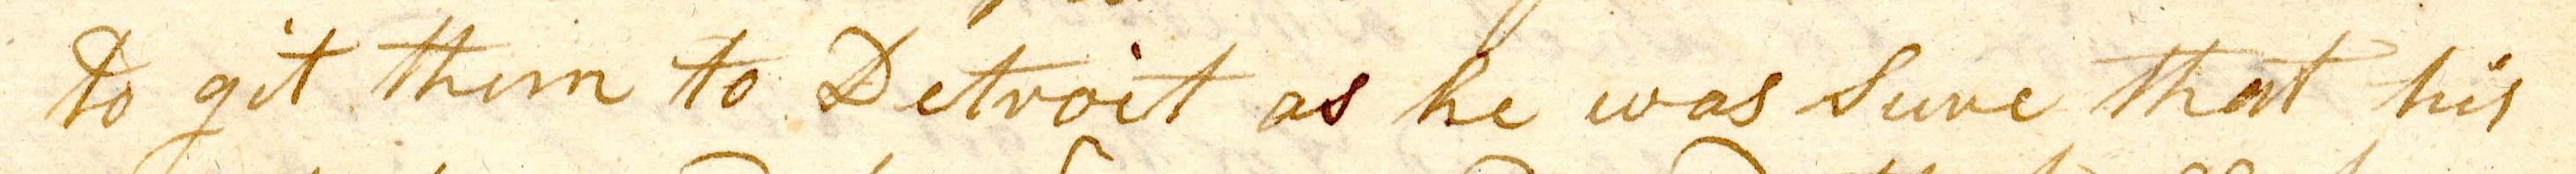to git them to Detroit as he was sure that his
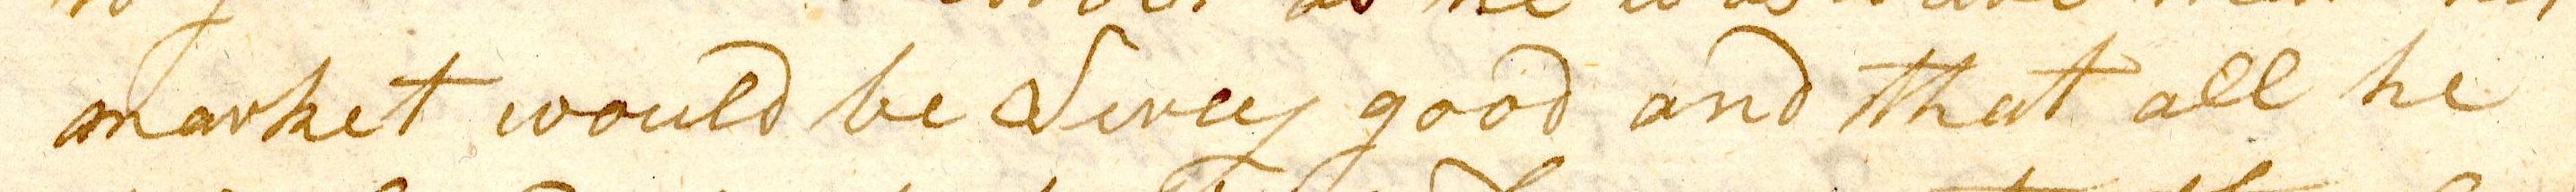market would be Verey good and that all he
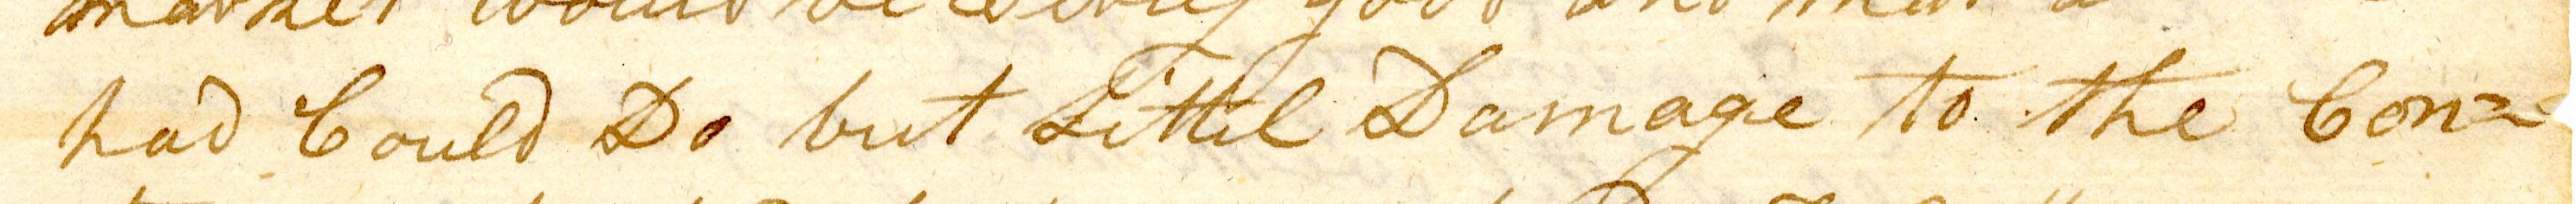had Could Do but Littel Damage to the Con-
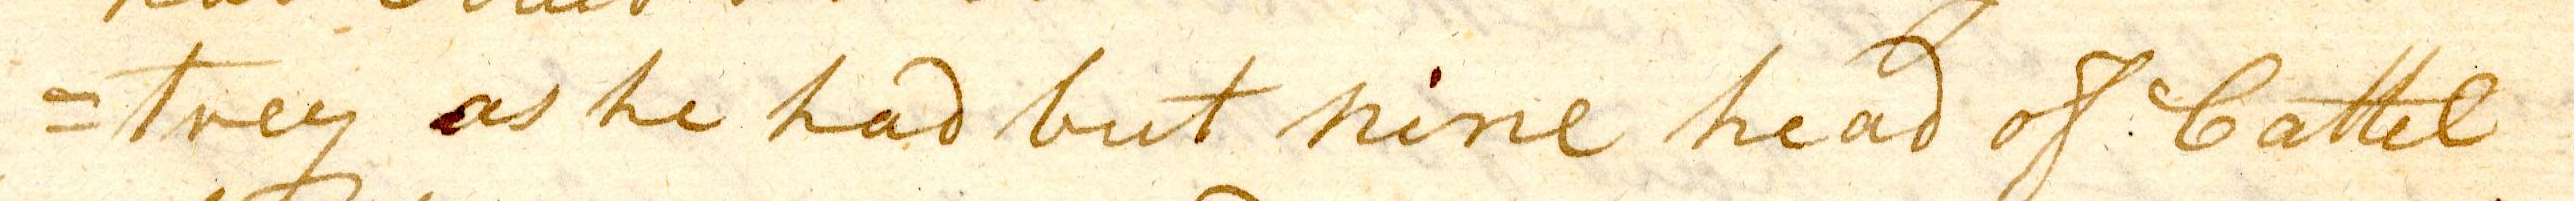-trey as he had but nine head of Cattel
